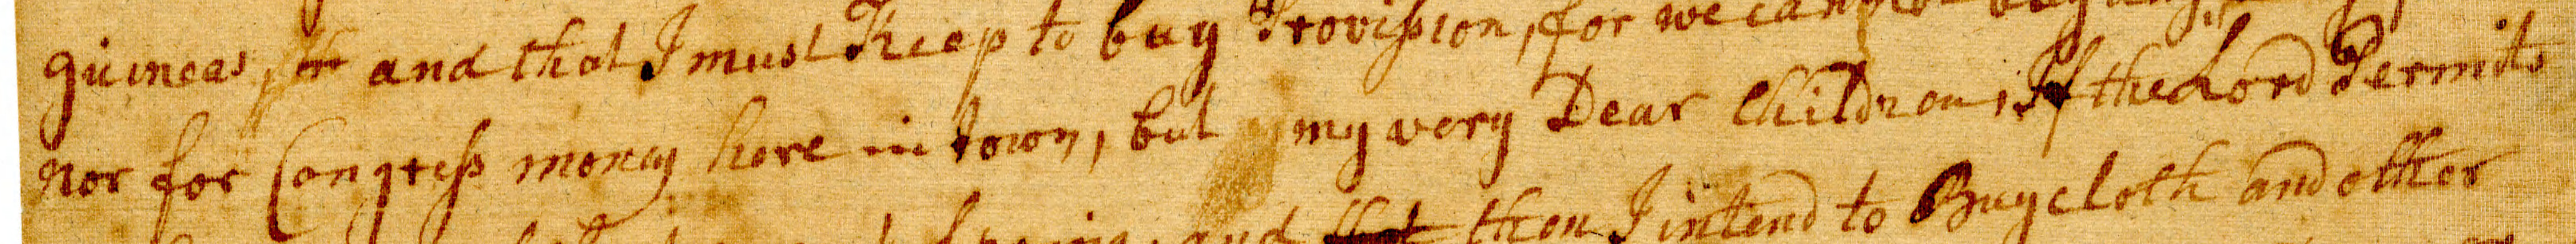nor for Congress money here in town, but my very Dear Children, If the Lord Permits
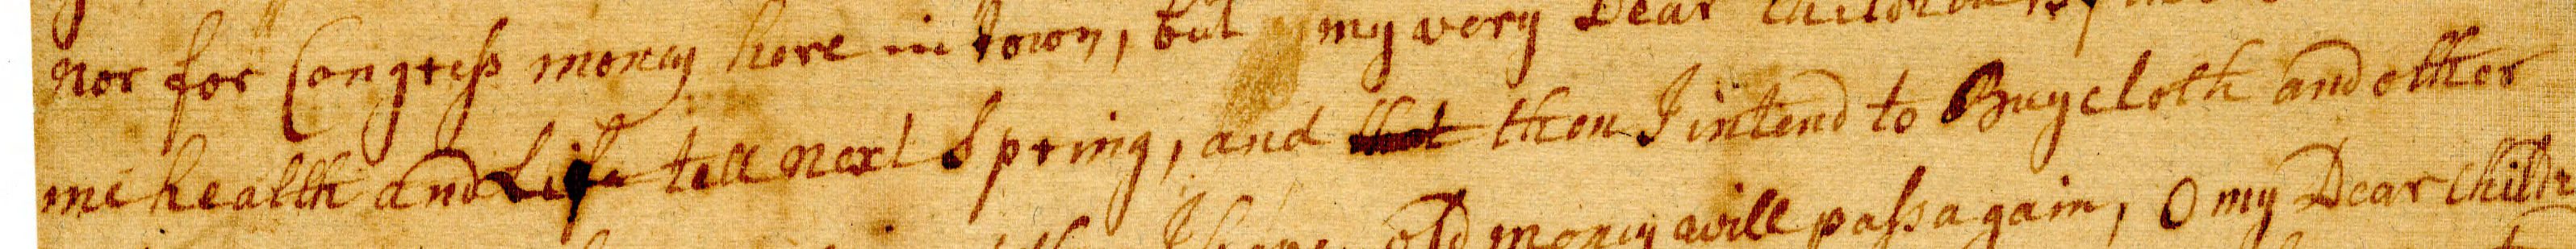me health and Life till next Spring, and then I intend to Buy cloth and other
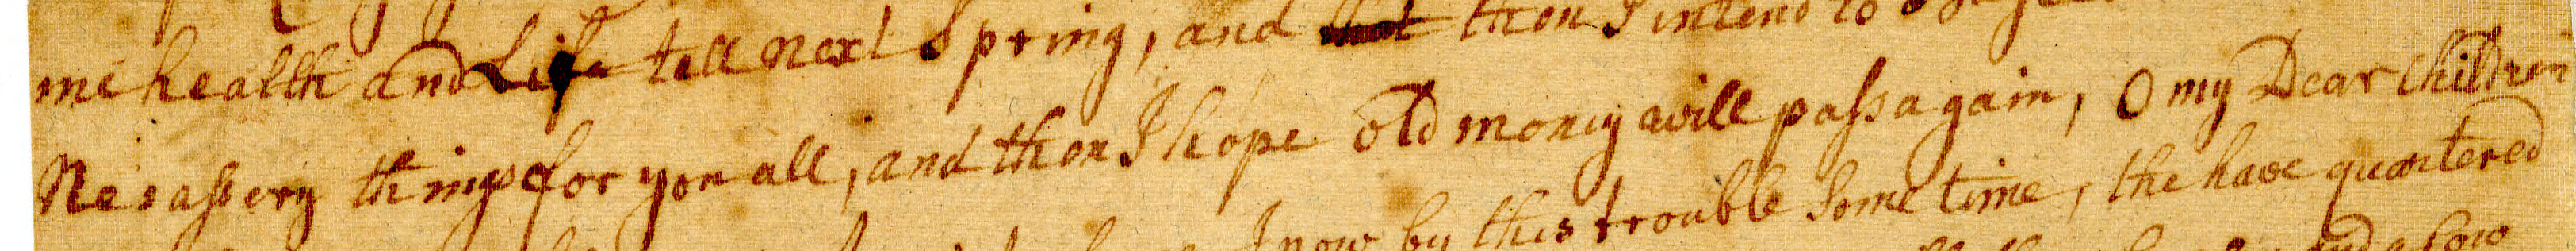Nesassery things for you all, and then I hope old money will pass again, O my Dear children
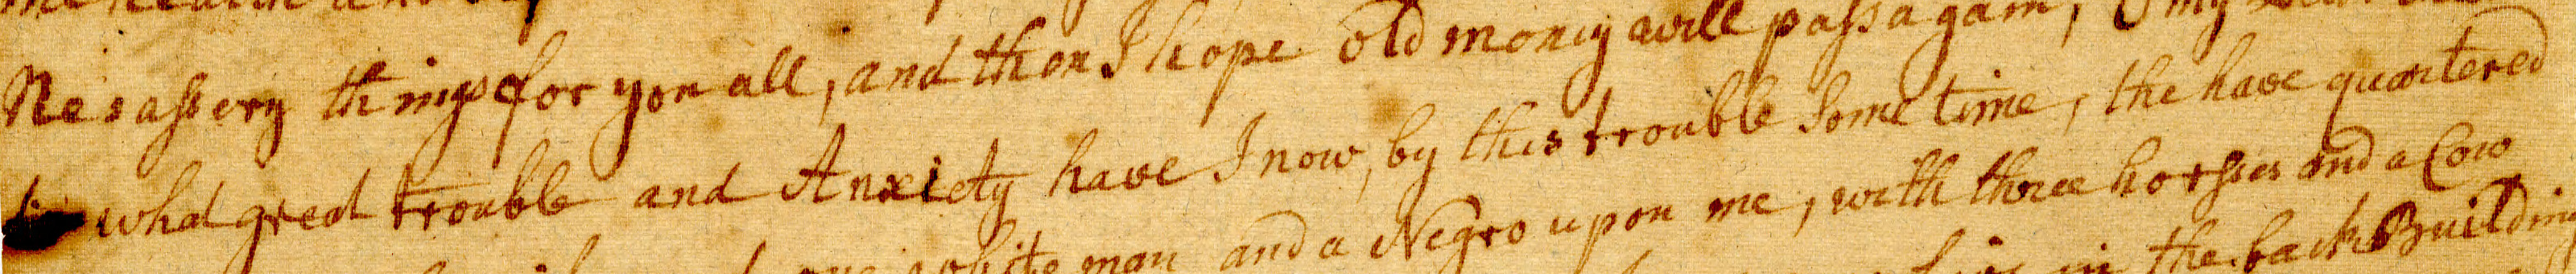what great trouble and Anxiety have I now by this trouble some time, the have quartered
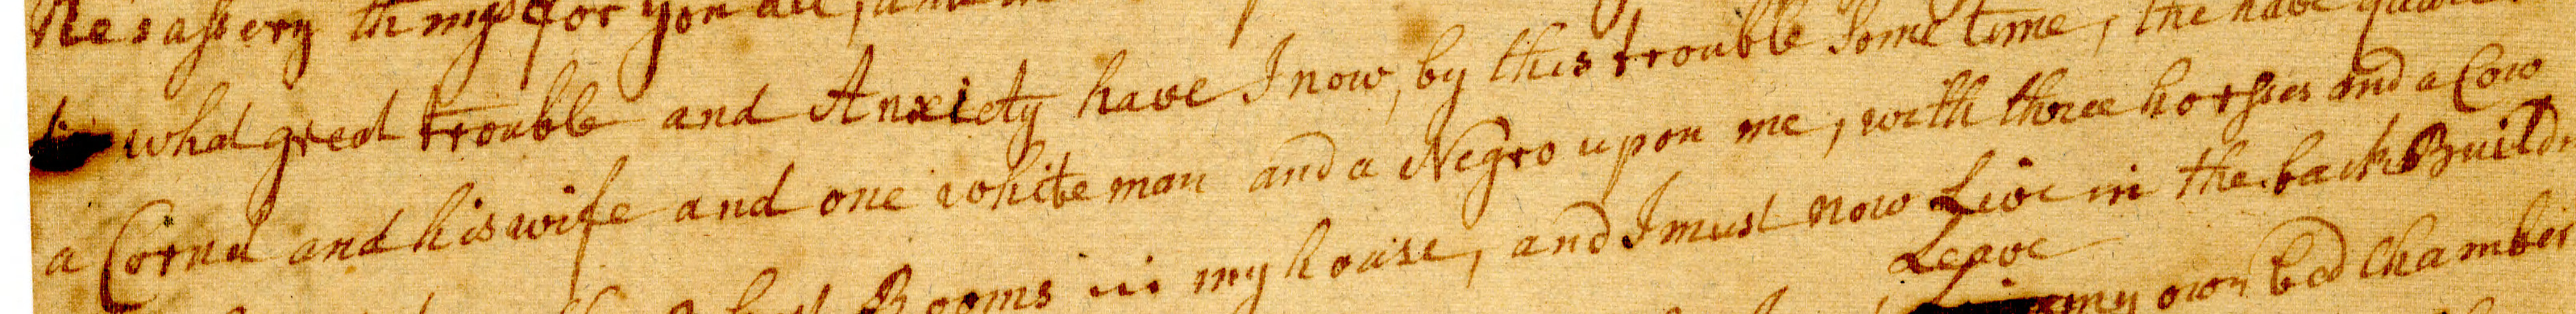a Cornal and his wife and one white man and a Negro upon me, with three horses and a Cow
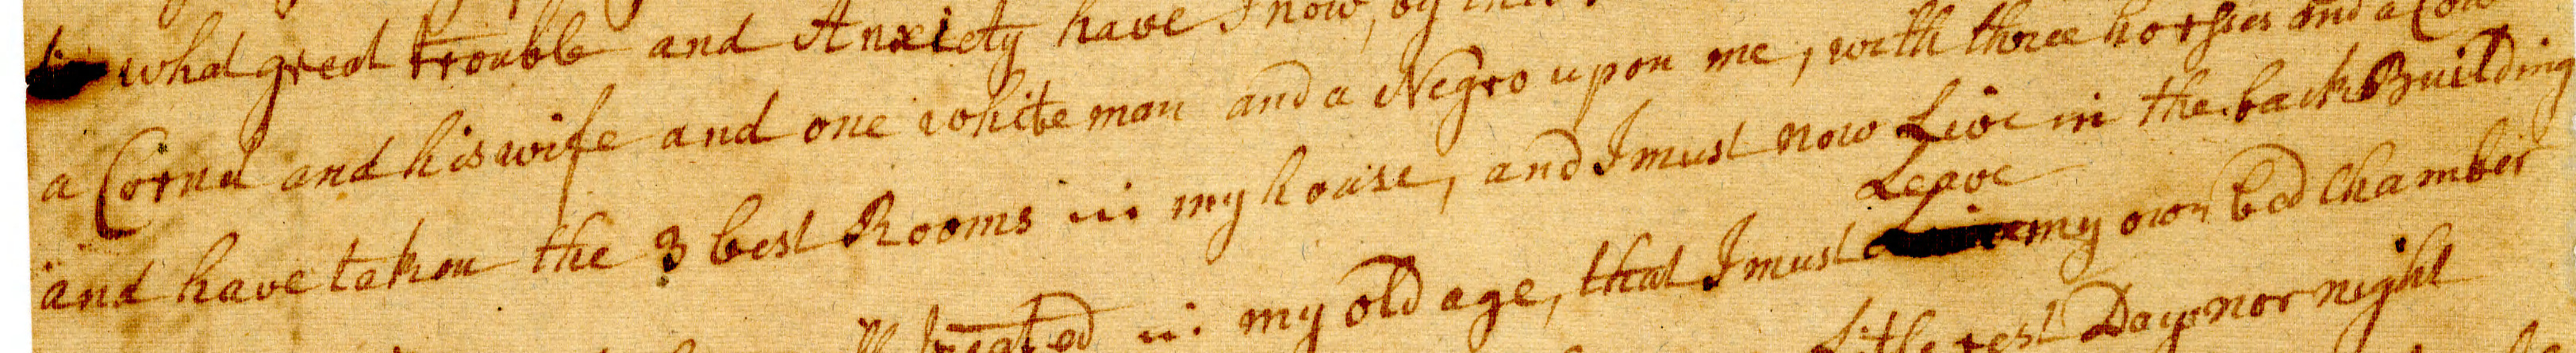and have taken the 3 best Rooms in my house, and I must now Live in the back Building
